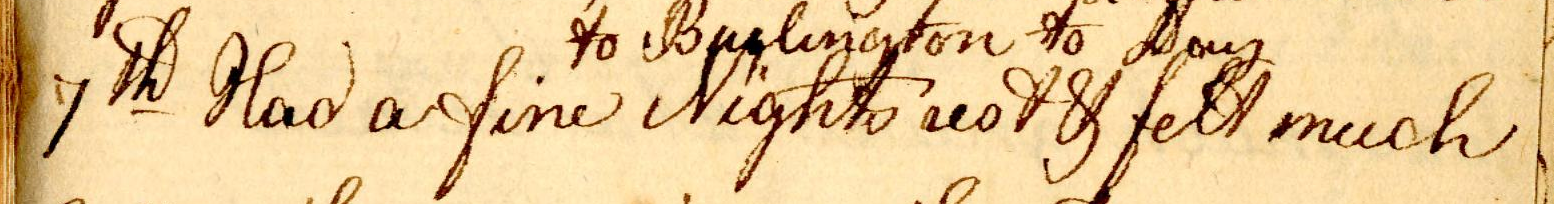7^th Had a fine Nights rest & felt much
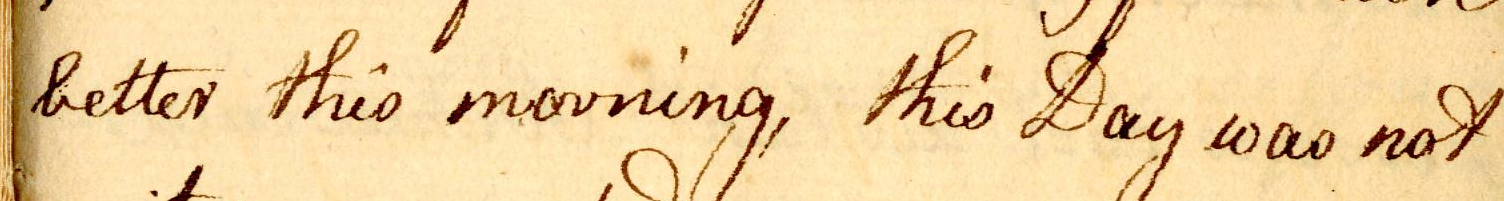better this morning, this Day was not
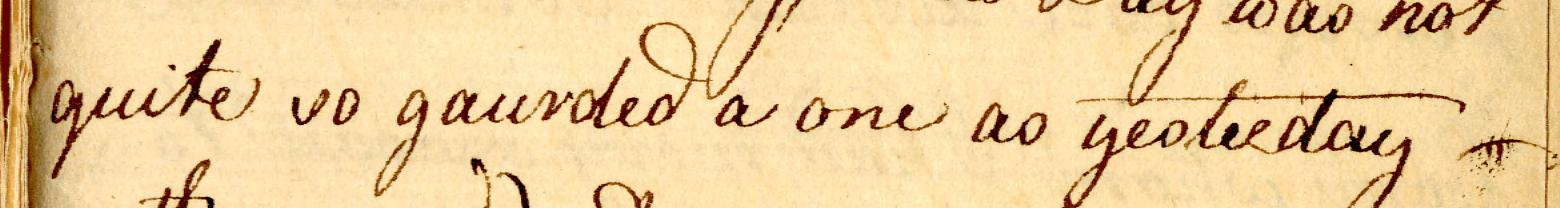quite so gaurded a one as yesterday-
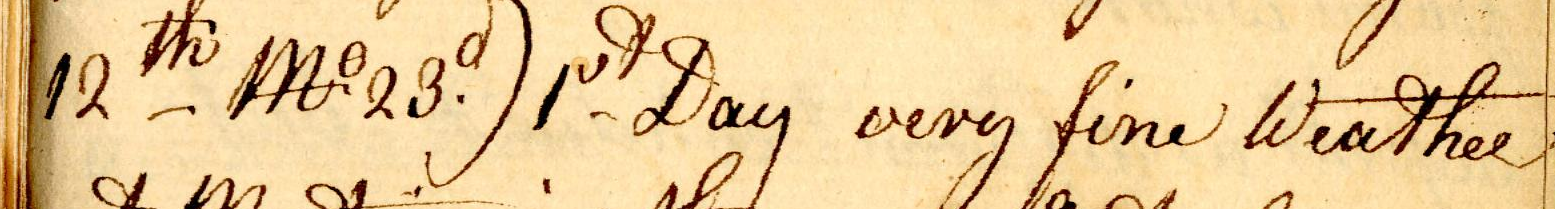12^th M^o 23^d.) 1^st Day very fine Weather
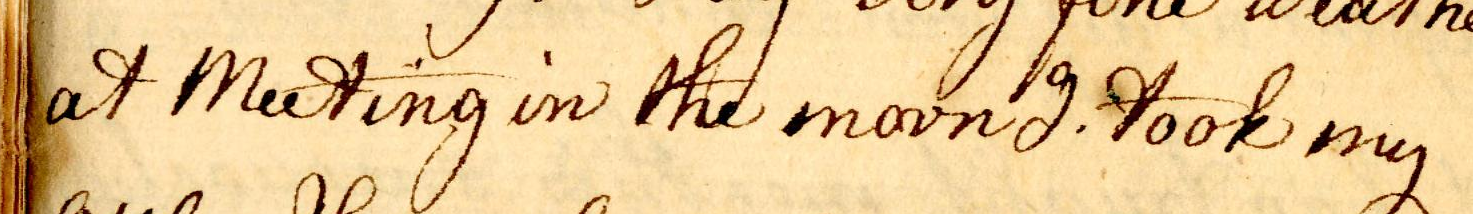at Meeting in the morn^g took my
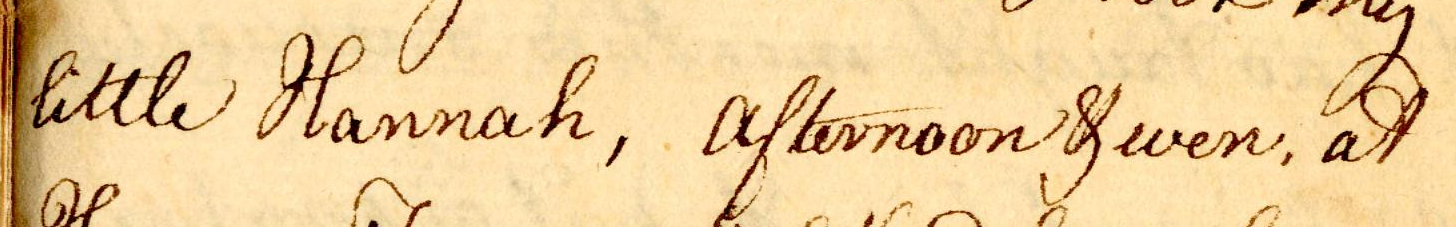little Hannah, Afternoon & even, at
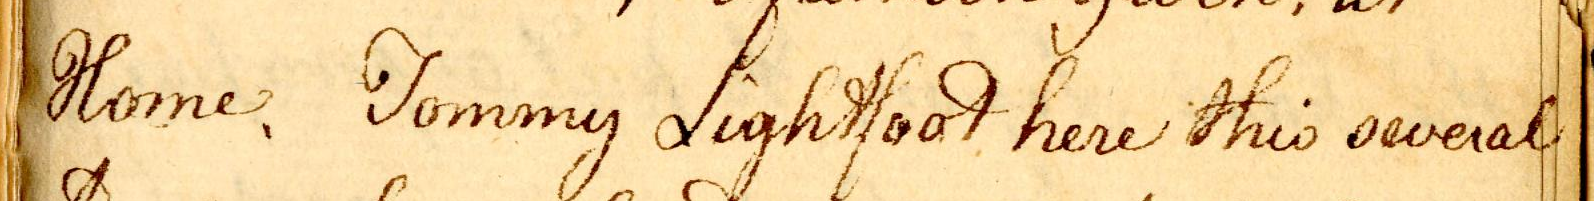Home, Tommy Lightfoot here this several
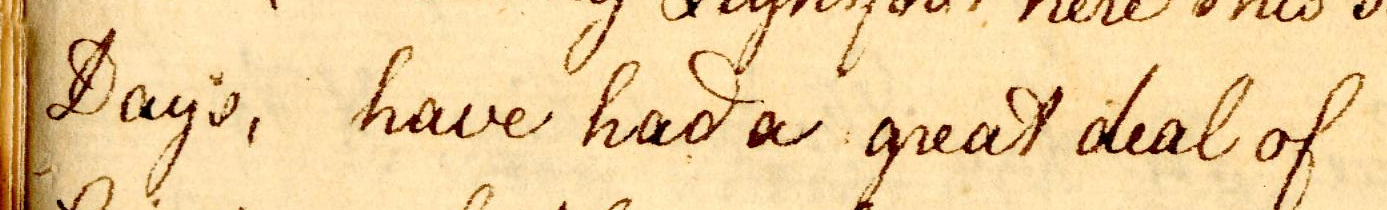Days, have had a great deal of
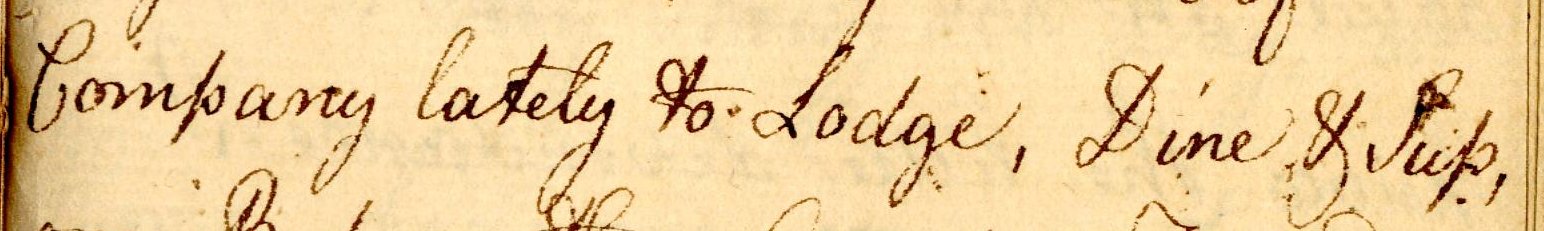Company lately to Lodge, Dine & Sup,
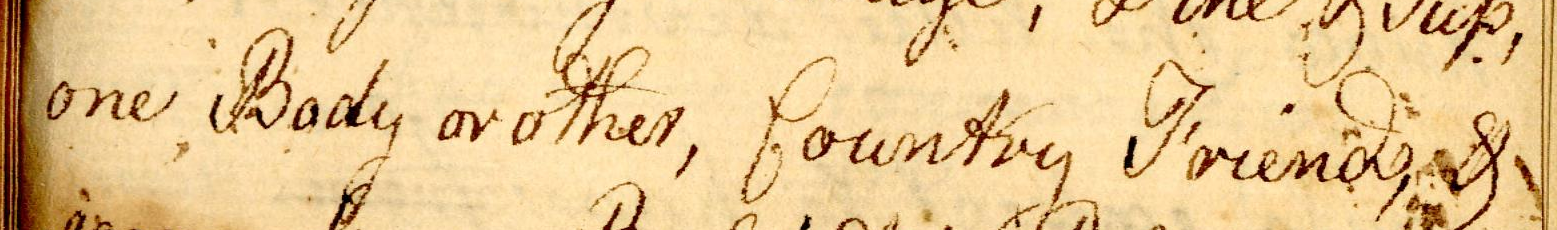one Body or other, Country Friends, &
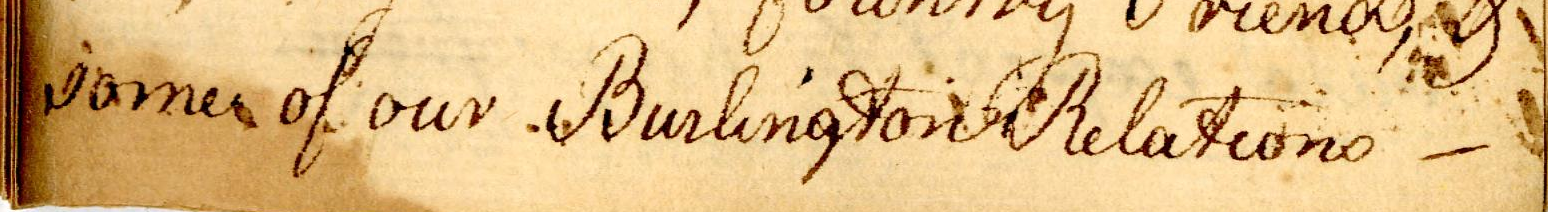some of our Burlington Relations
